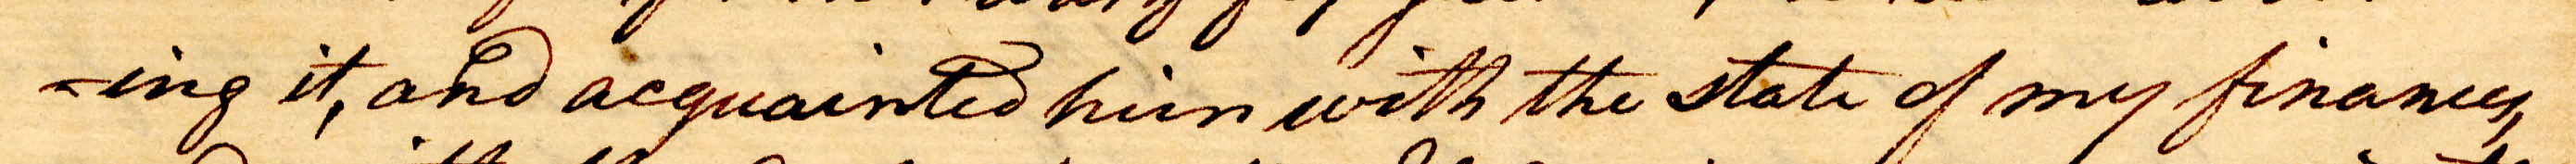-ing it, and acquainted him with the state of my finances,
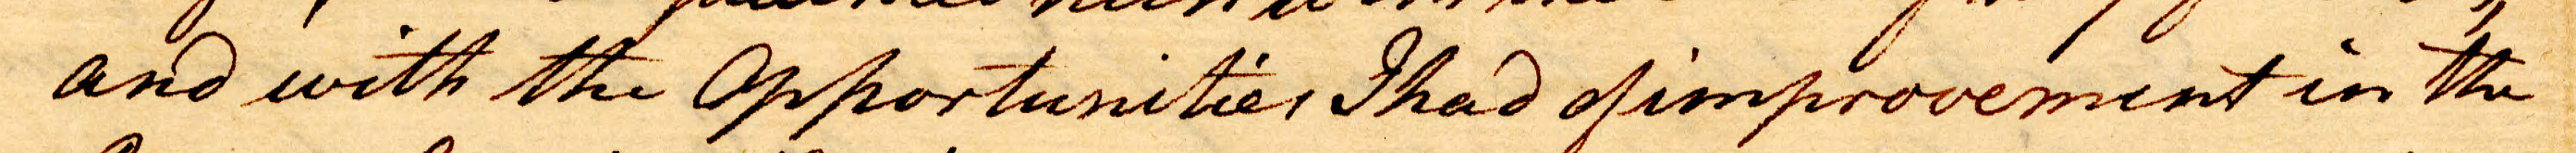and with the Opportunities I had of improvement in the
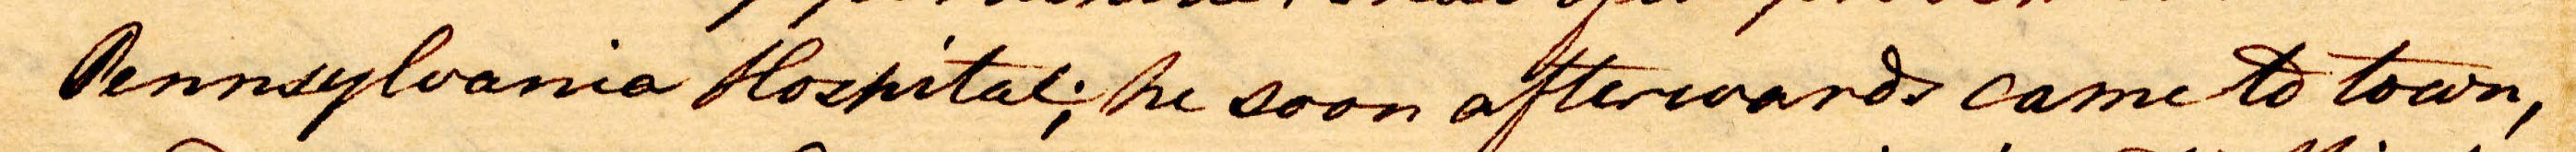Pennsylvania Hospital; he soon afterwards came to town,
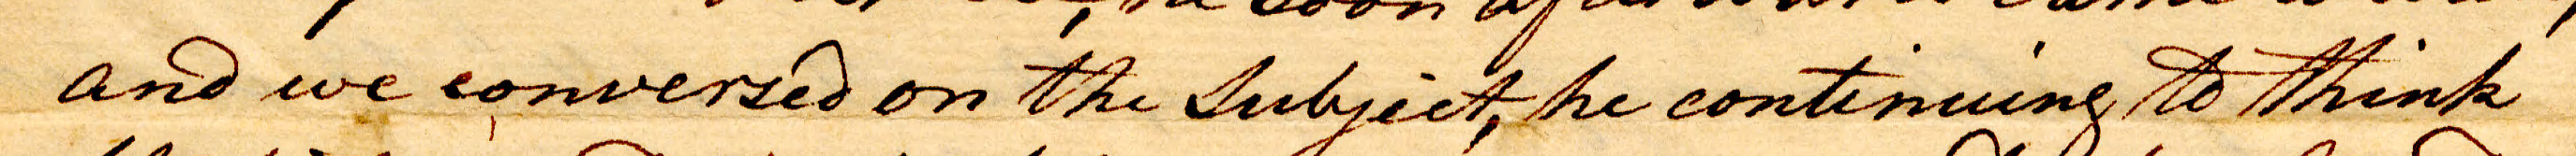and we conversed on the Subject, he continuing to think
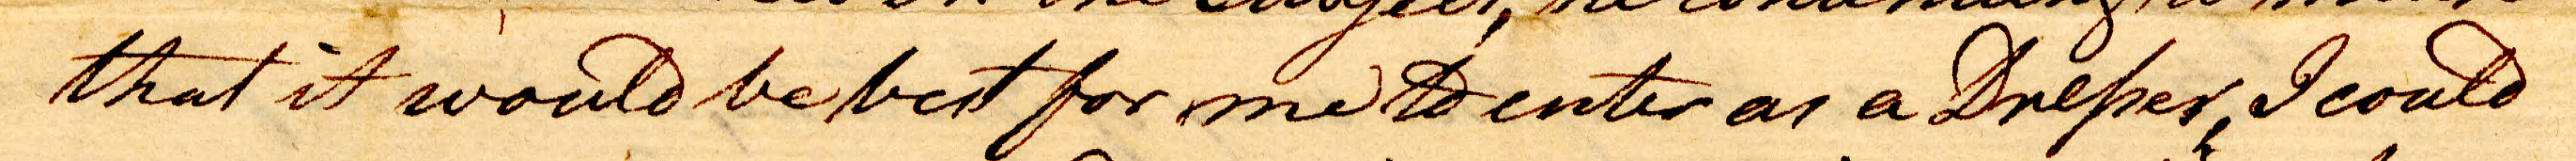that it would be but for me to enter as a Dresser, I could
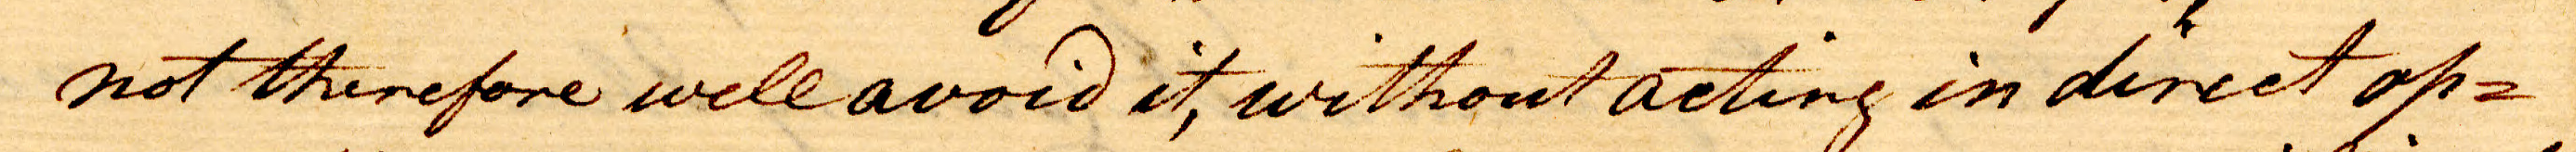not therefore well avoid it, without acting in direct op-
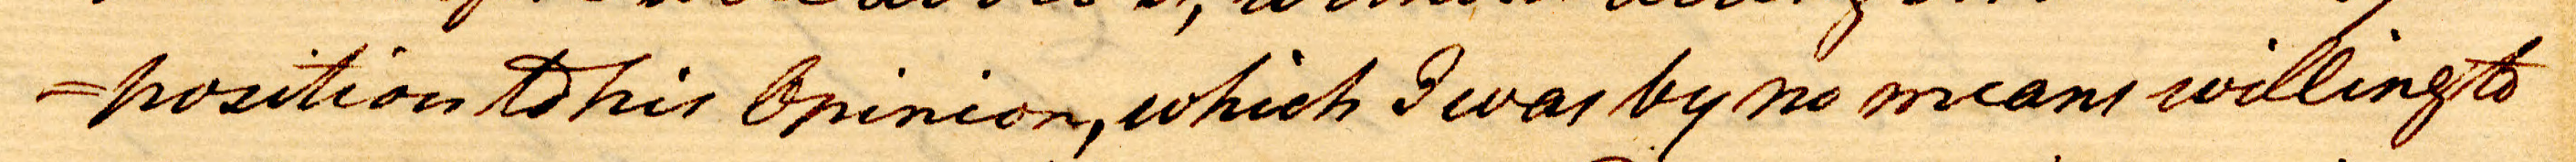-position to his Opinion, which I was by no means willing to
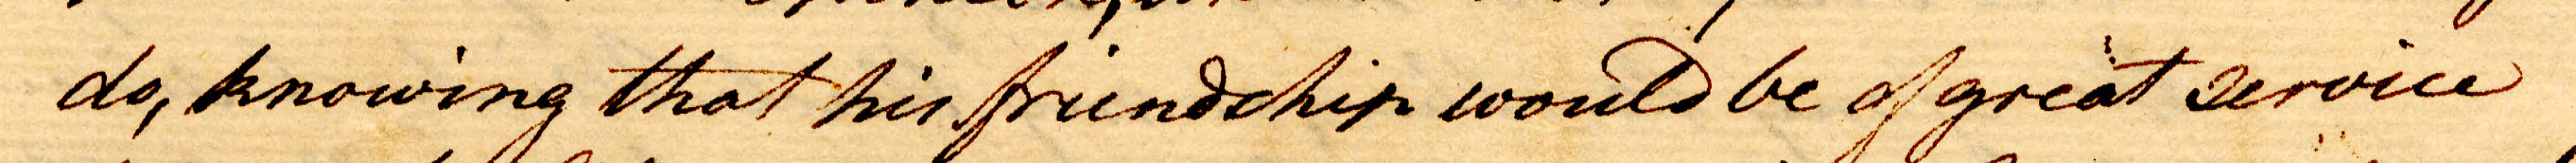do, knowing that his friendship would be of great service
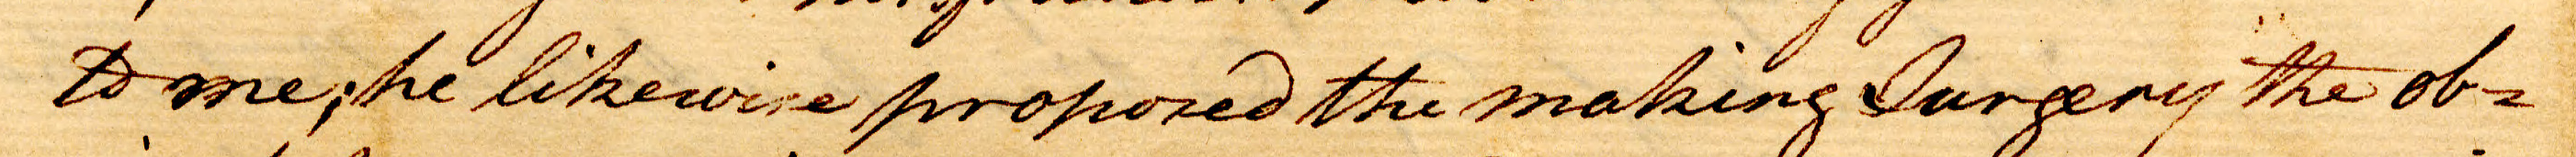to me; he likewise proposed the making Surgery the ob-
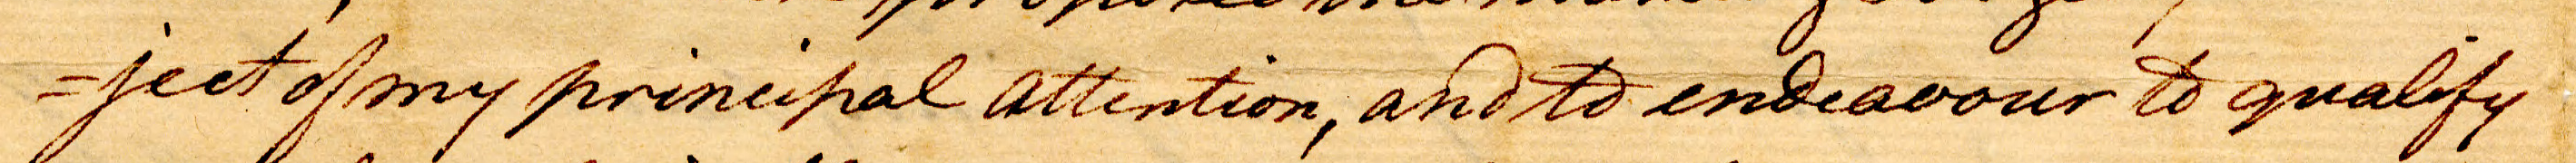-ject of my principal attention, and to endeavour to qualify
